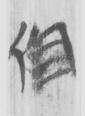於
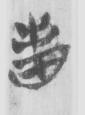{丰田}
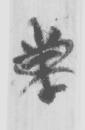東
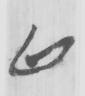㠯（以）
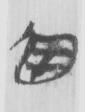西
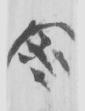罙
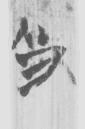及
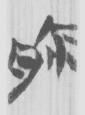{肉亦}
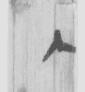六
